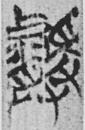○（渙）
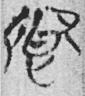卿（享）
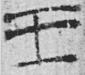王
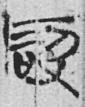叚（假）
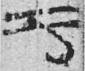于
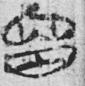○（廟）
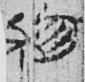利
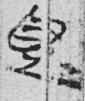見
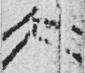大
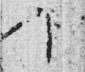人
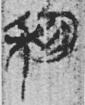利
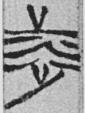涉
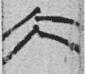大
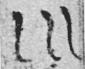川
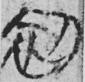初
